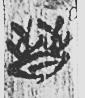晉
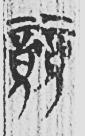競
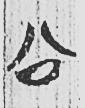公
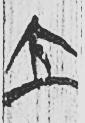立
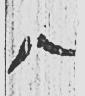八
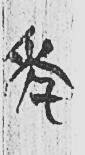年
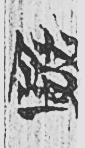{阜圭㕛}
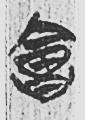會
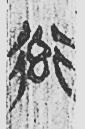率
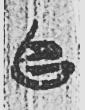𠂤
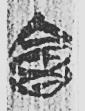會
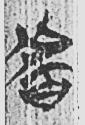者
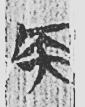侯
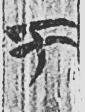于
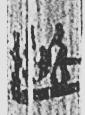{𠃊𢆶一}
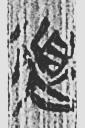道
